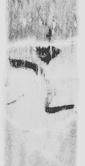{十九}
